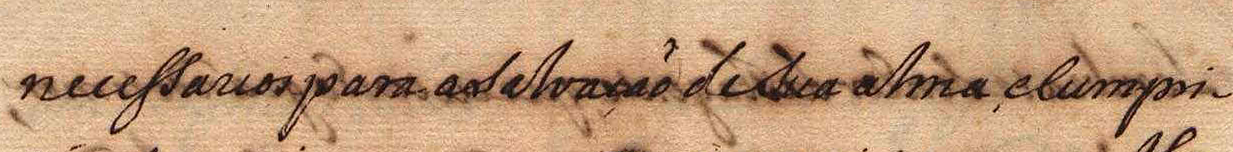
necessarios para a salvaçaõ de sua alma, e cumpri
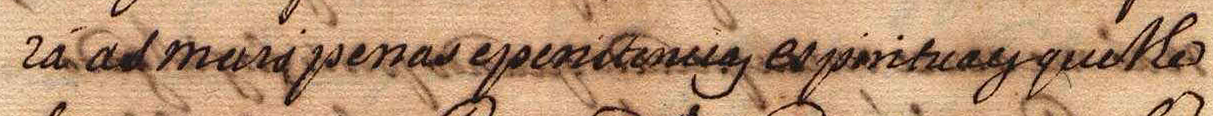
rá as mais penas e penitencias espirituaes que lhe
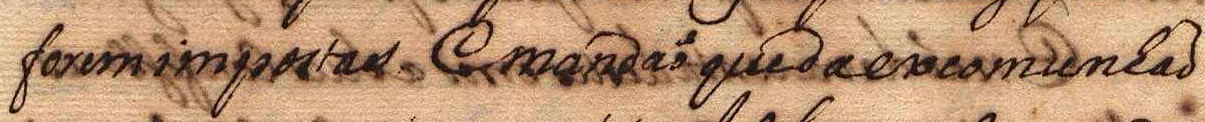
forem impostas E mandaõ que da excomunhaõ
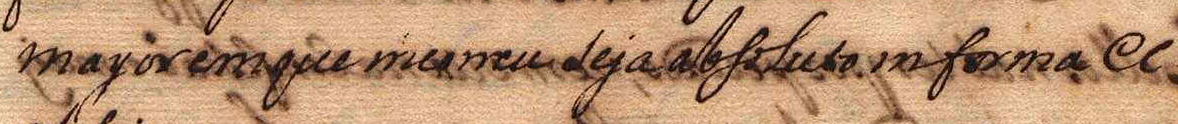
mayor em que incorreu seja absoluto in forma ec
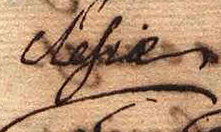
clesiæ
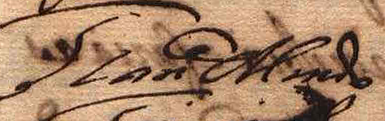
Fran.co Mendo
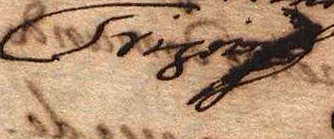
Trigozo
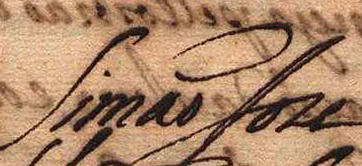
Simaõ Joze
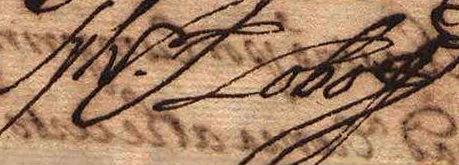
sylv.ra Lobo
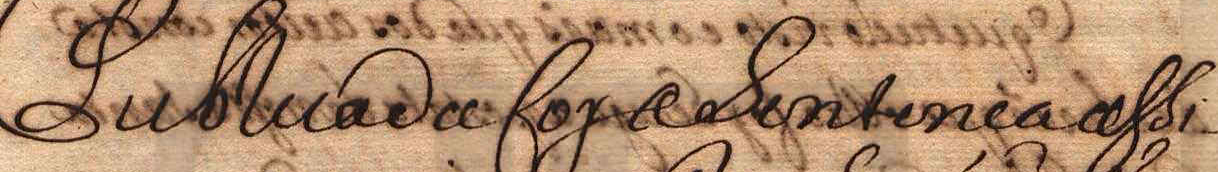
Publicada foy a Sentença assi
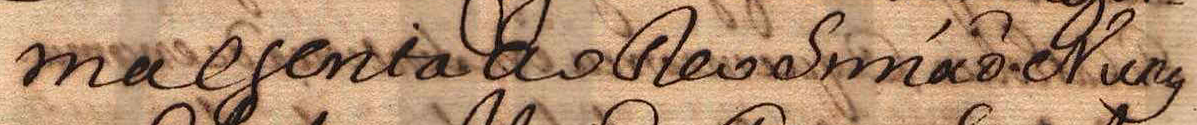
ma escrita ao Reo Simaõ Nunes
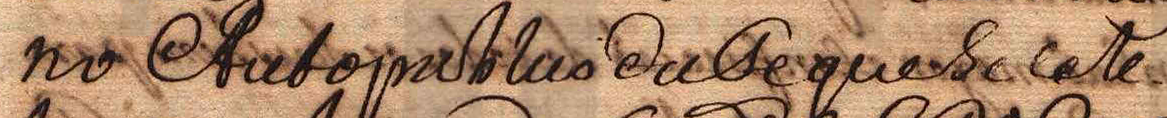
no Auto publico da Fe que Se cele
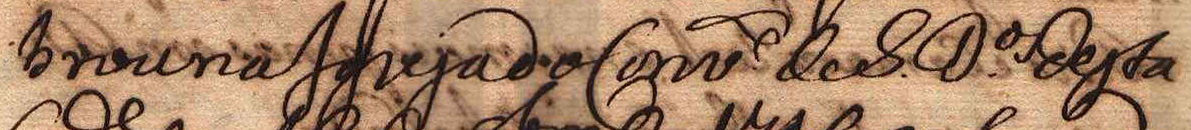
brou na Jgreja do Conv.to de S. D.os desta
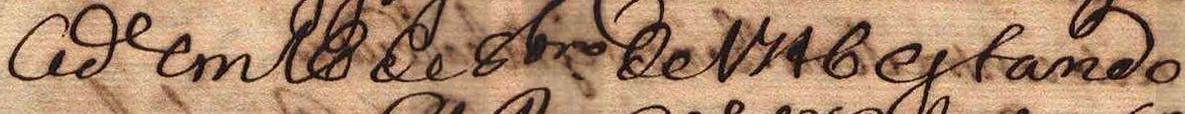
Cide em 10 de 8bro de 1746 estando
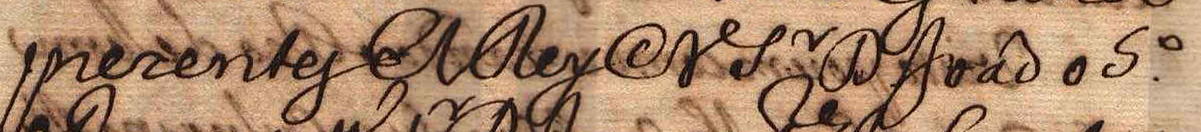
prezentes El Rey N S.r D Joaõ o 5.o
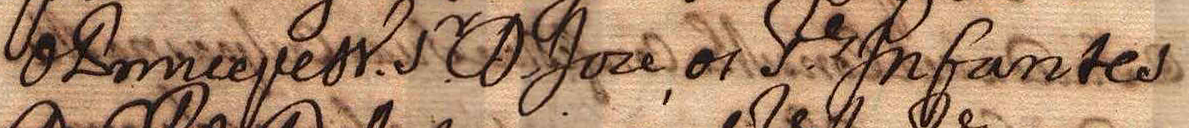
o Principe n. sr. D. Joze, os S.res Jnfantes
